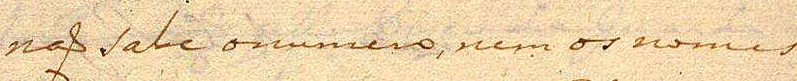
naõ sabe o numero nem os nomes
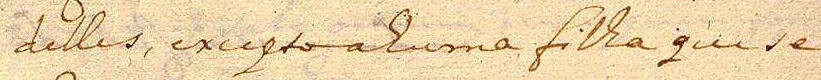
delles, excepto a huma filha que se
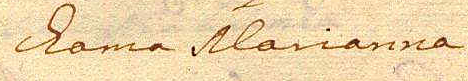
chama Marianna.
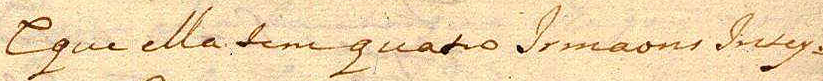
E que ella tem quatro Irmaons Intey
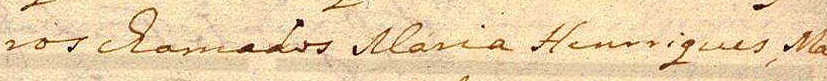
ros chamados Maria Henrriques, Ma
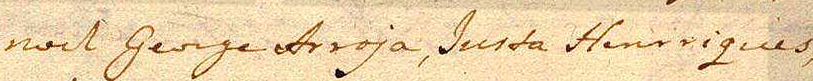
noel George Arroja, Iusta Henrriques,
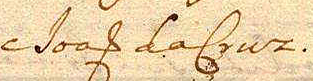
e Ioaõ da Cruz.
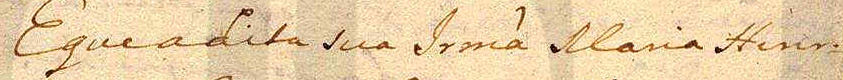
E que a dita sua Irmã Maria Henr
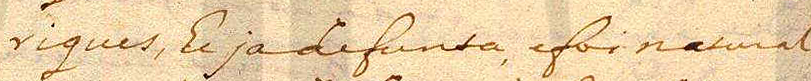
riques, he ja defunta, e foi natural
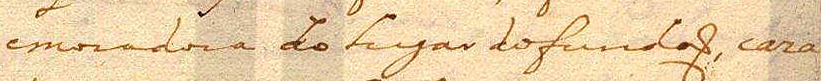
e moradora do lugar do fundaõ, caza
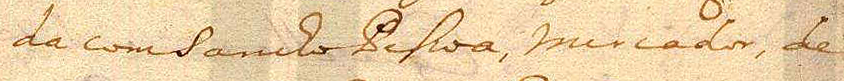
da com Sancho Pessoa, mercador, de
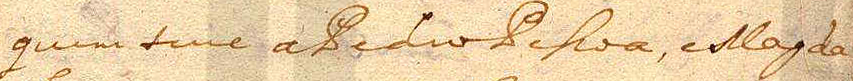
quem teue a Pedro Pessoa, e Magda
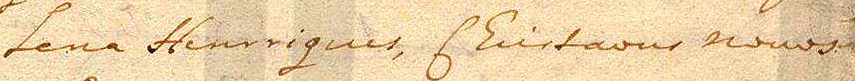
Lena Henrriques, Chistaons nouos
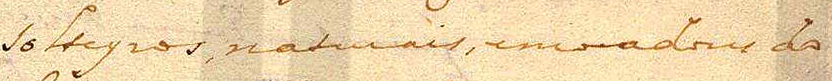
solteyros, naturais, e moradores do
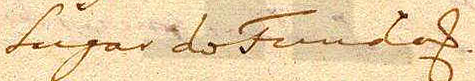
Lugar do Fundaõ.
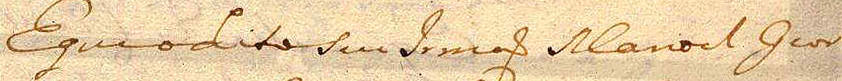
E que o dito seu Irmaõ Manoel Geor
